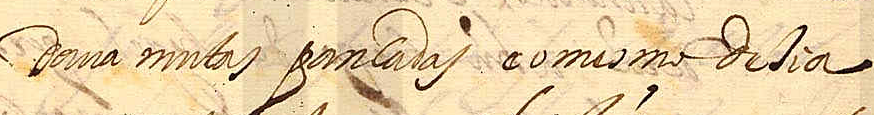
daua mutas pancadas e o mesmo desia
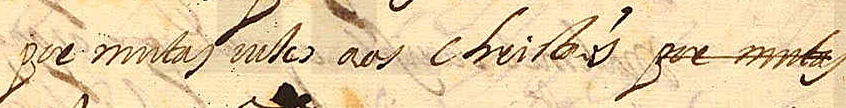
por mutas ueses aos christaõs por mutas
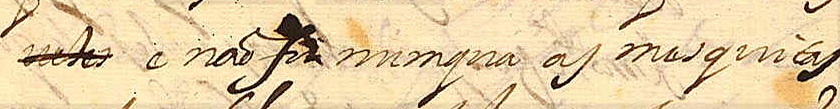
ueses e naõ foi numqua as mesquitas
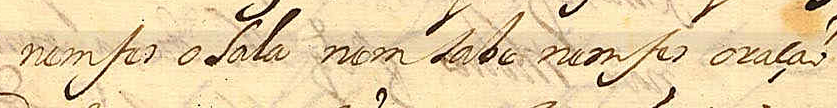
nem fes o sala nem sabe nem fes oraçaõ
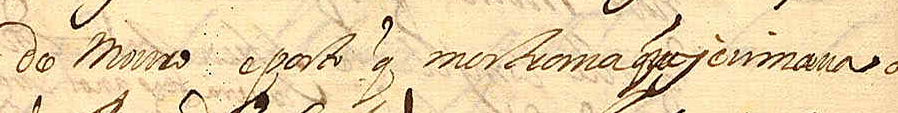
de mouro e posto q̄ mostraua que jeivmaua o
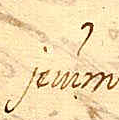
jeium
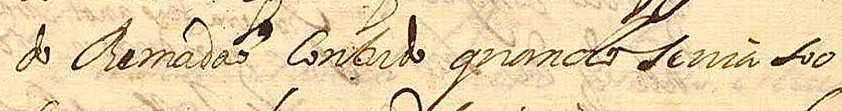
do Ramadaõ contudo quando se uia soo
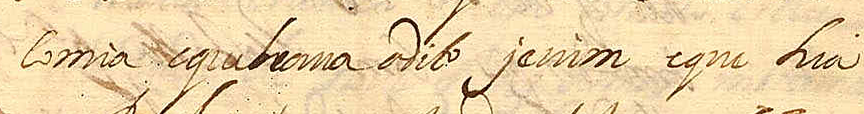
comia e quebraua o dito jeium e que hia
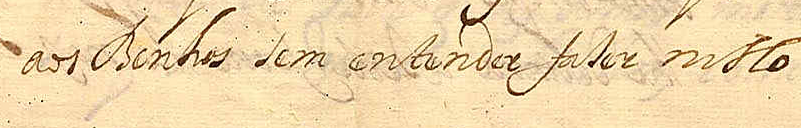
aos Banhos sem entender faser nisso
